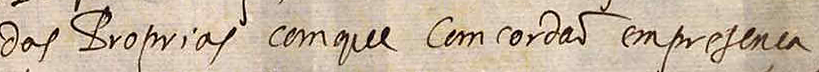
das Proprias com que comcordaõ em presença
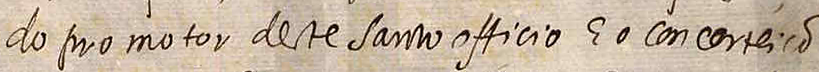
do promotor deste Santo officio E o concertei cō
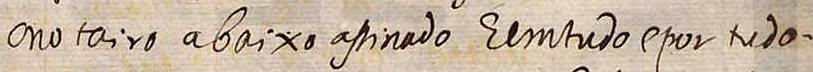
o notairo abaixo assinado E em tudo e por tudo
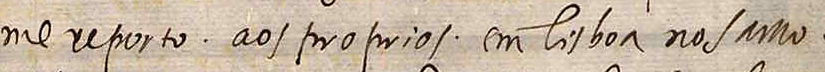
me reporto aos proprios. em lisboa no Santo
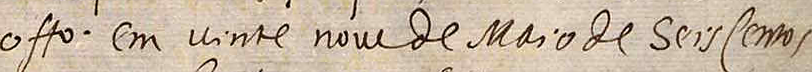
offo. em uinte noue de Maio de SeisCentos
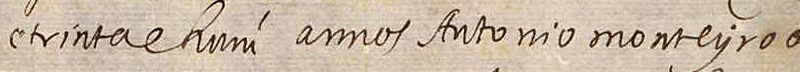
e trinta e hum annos Antonio monteyro o
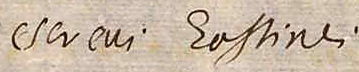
escreui E o assinei.
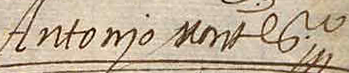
Antonjo Monte.ro
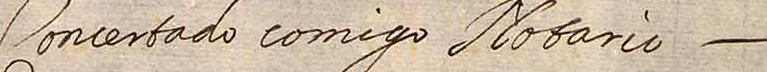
Concertado comigo Notario
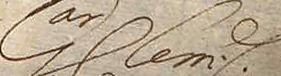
G.ar Clem.e
